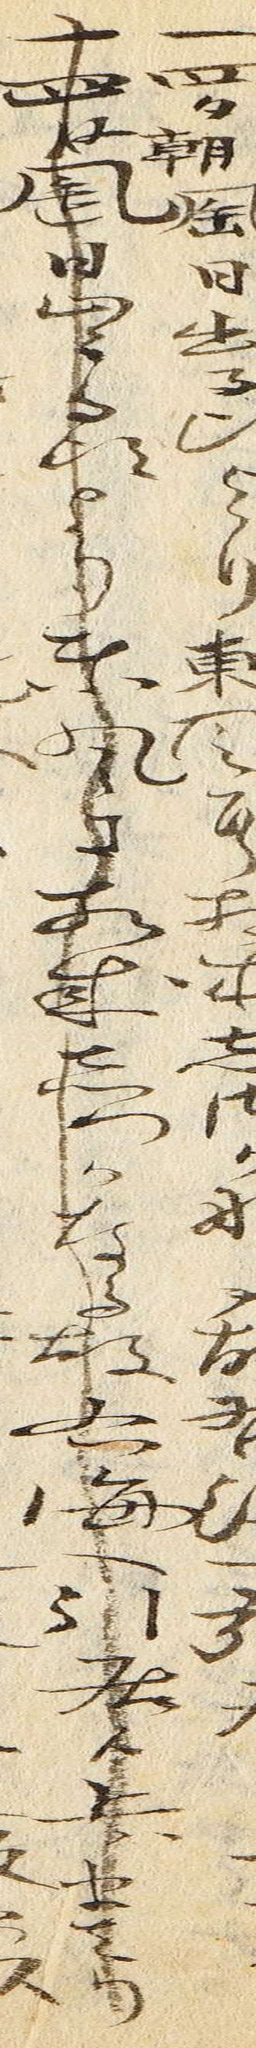一四日朝凪日出る頃より東風に相成しつかなる故右海へ引居候上ハまハり
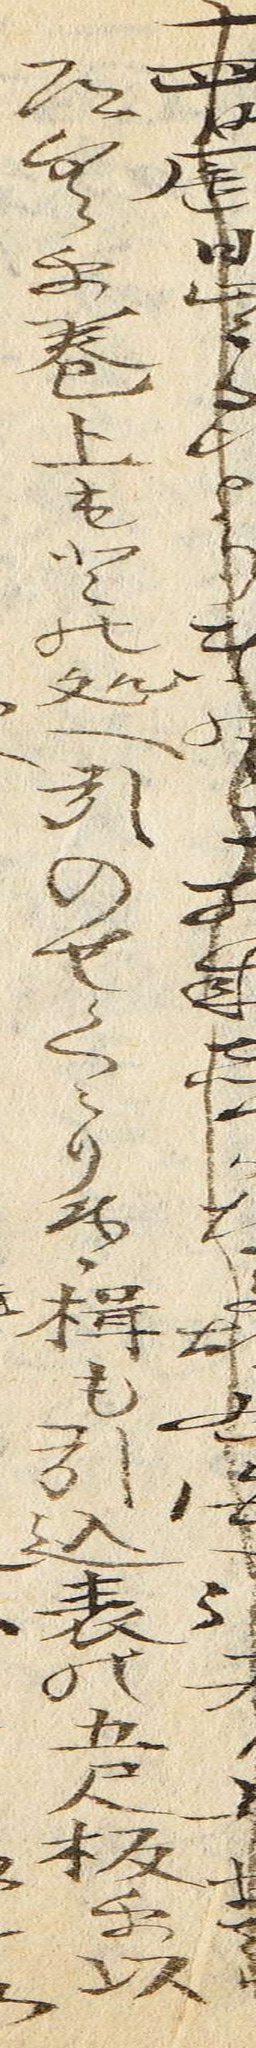道具を巻上もとの処へ引のせくゝり付候楫も引込表の五尺板を以
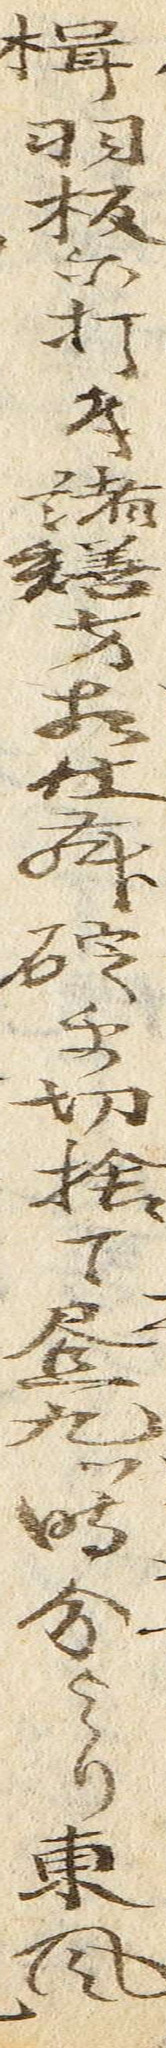楫羽板に打付諸繕方相仕舞碇を切捨て昼九ツ時分より東風
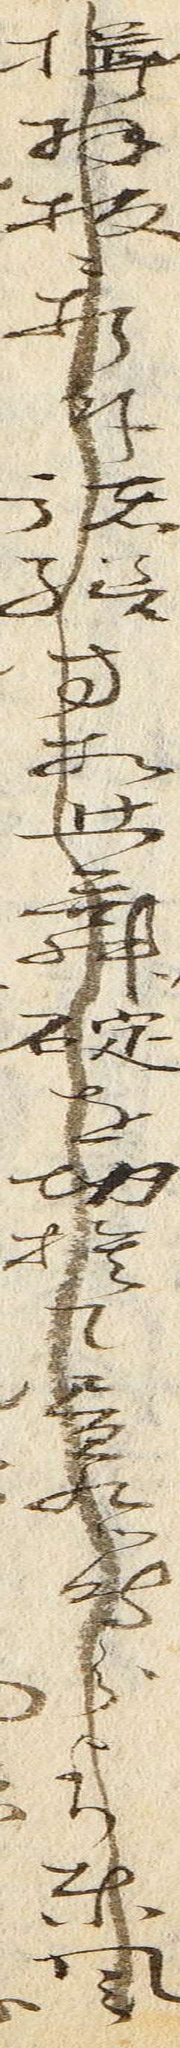楫羽板に打付諸繕方相仕舞碇を切捨て昼九ツ時分より東風
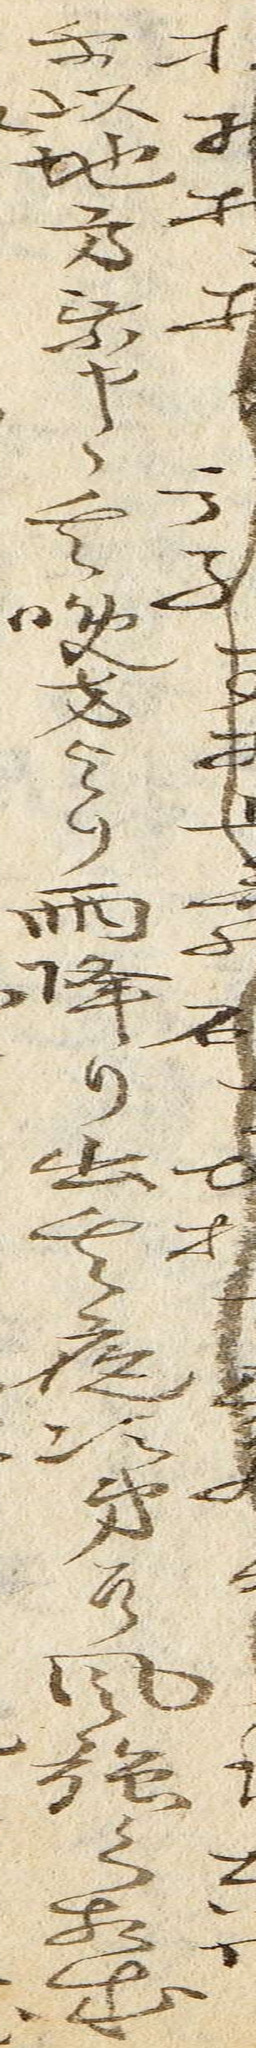を以地方乗申候其晩方より雨降り出其夜次第に風強く相成
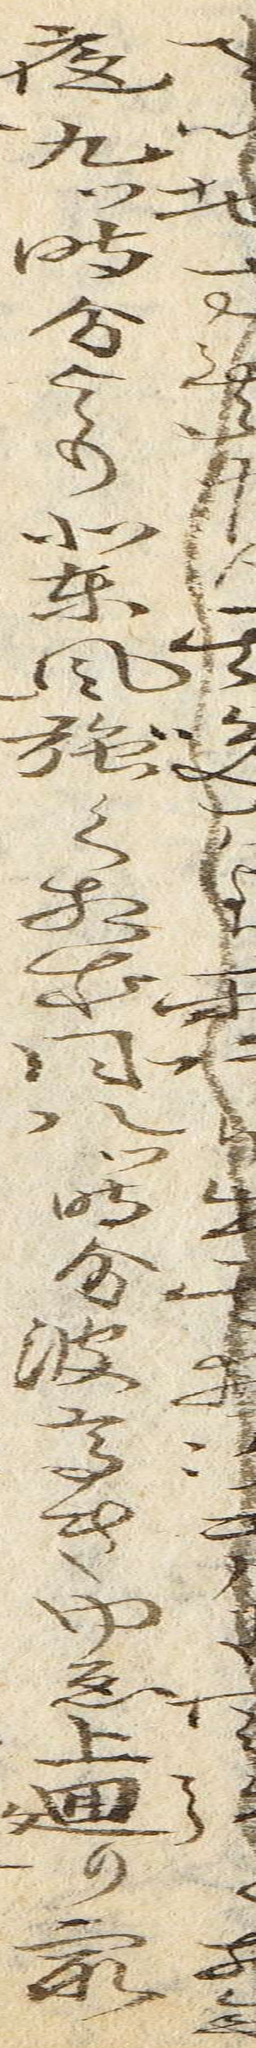夜九ツ時分より北東風強く相成同八ツ時分波高きゆゑ上廻り最
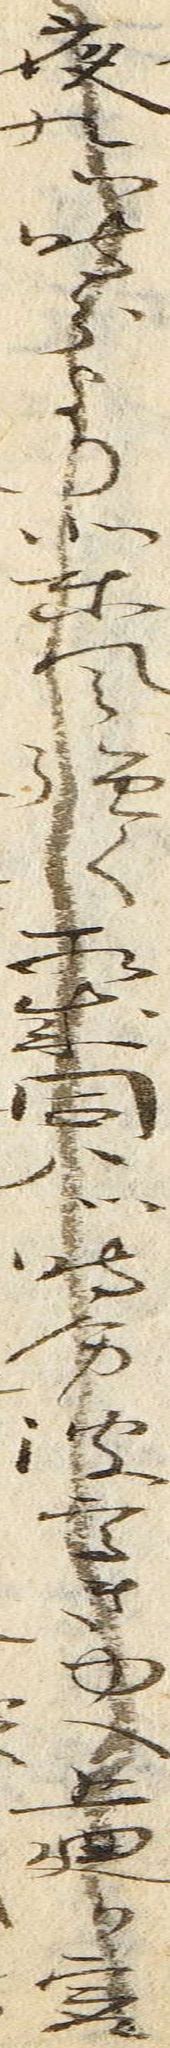夜九ツ時分より北東風強く相成同八ツ時分波高きゆゑ上廻り最
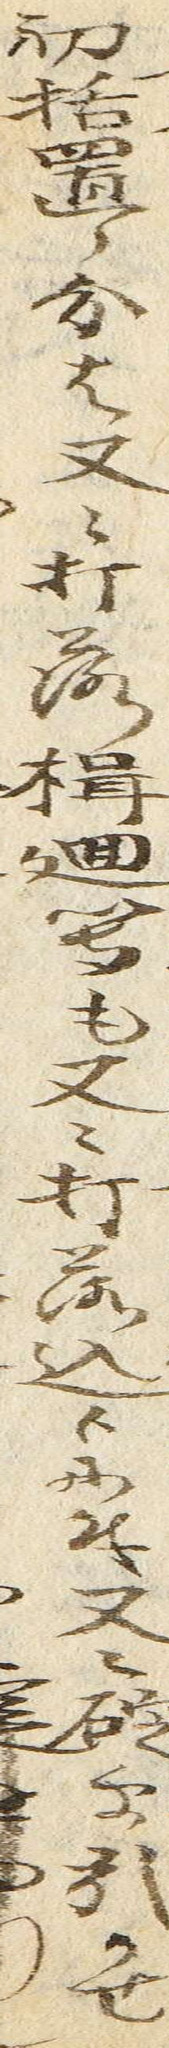初括置候分者又々打落楫廻等も又々打落込候に付又々碇を引かせ
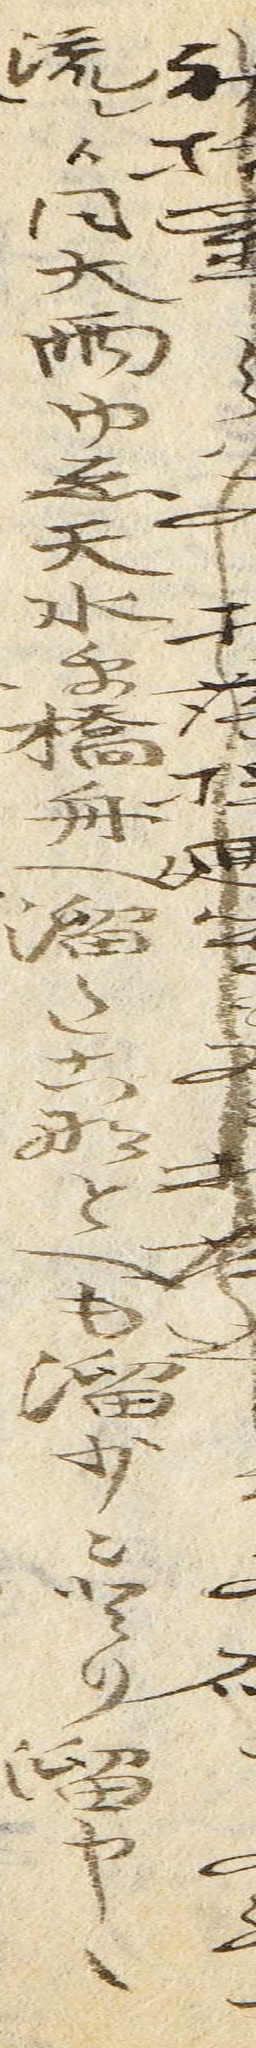流レ候内大雨ゆゑ天水を橋舟へ溜たこなとへも溜少々とり溜申候
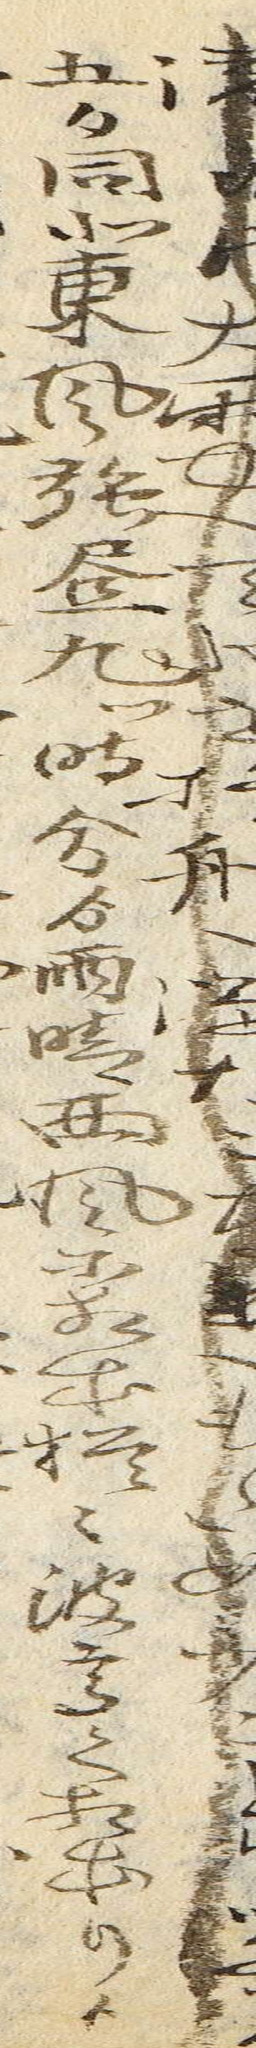一五日同北東風強昼九ツ時分ゟ雨晴西風に相成猶々波高く相成り候
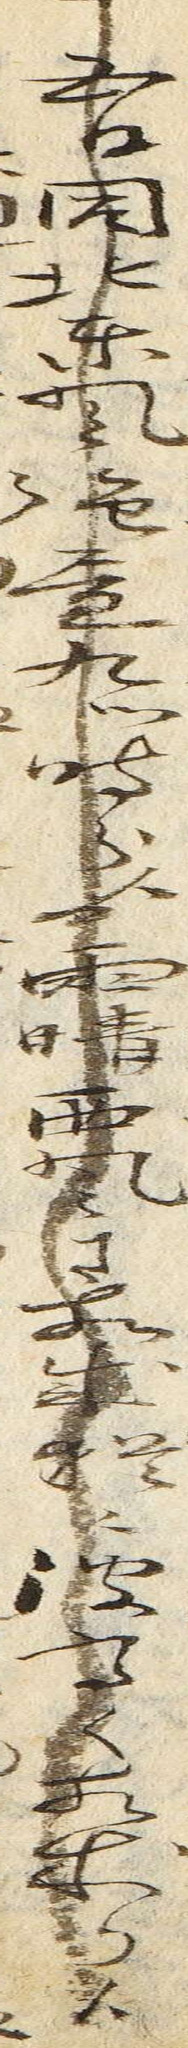一五日同北東風強昼九ツ時分ゟ雨晴西風に相成猶々波高く相成り候
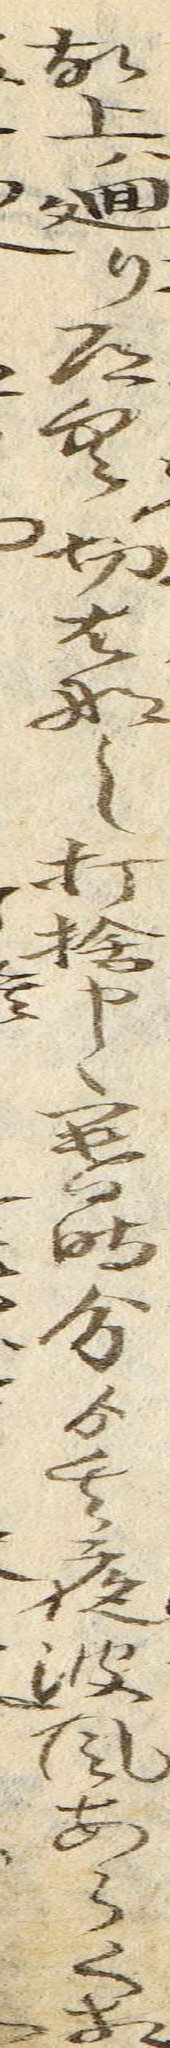故上ハ廻り道具切はなし打捨申候暮時分ゟ其夜波風あらく相
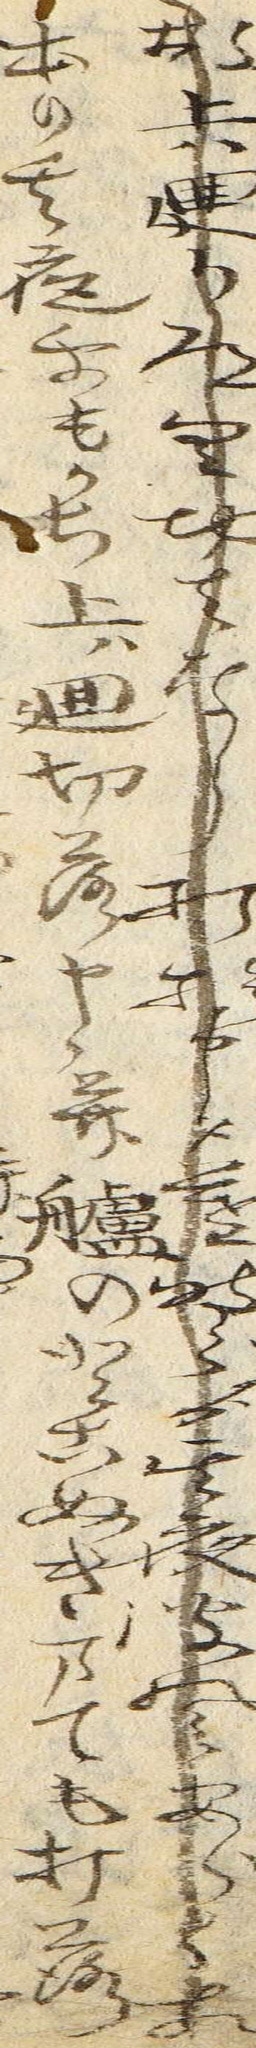成り其夜をもかち上ハ廻切落申候并艫のとこぬきまても打落

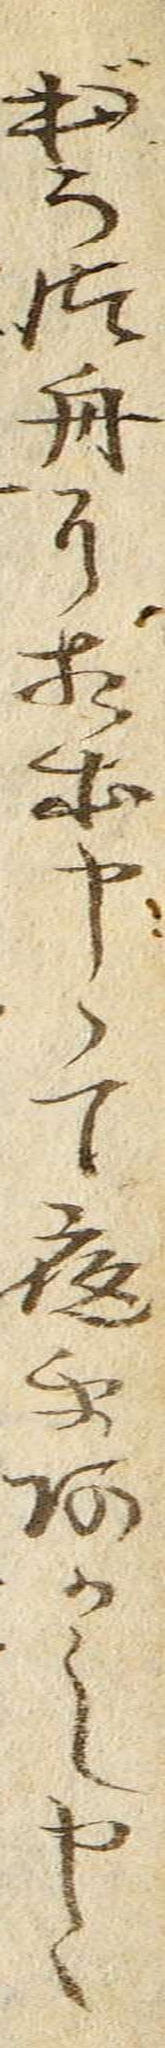ぼうつ舟に相成申候て夜をあかし申候
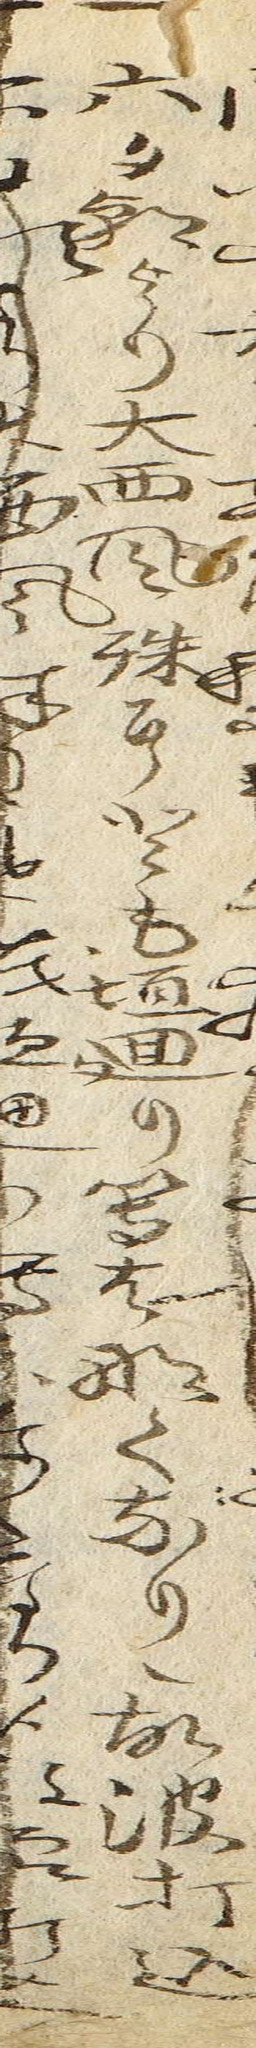一六日朝より大西風殊にとも垣廻り等者なくなり候故波打込
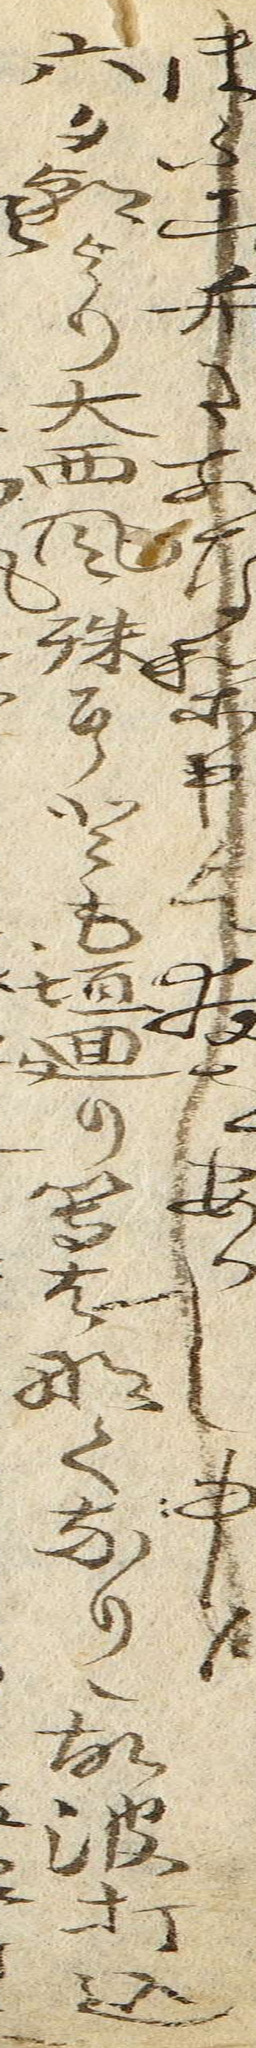一六日朝より大西風殊にとも垣廻り等者なくなり候故波打込
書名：無人島漂流書付
